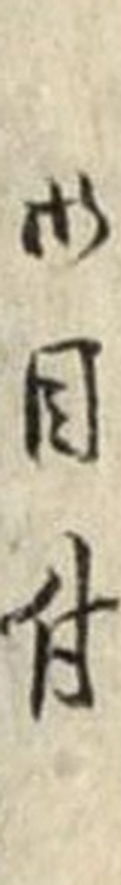御目付
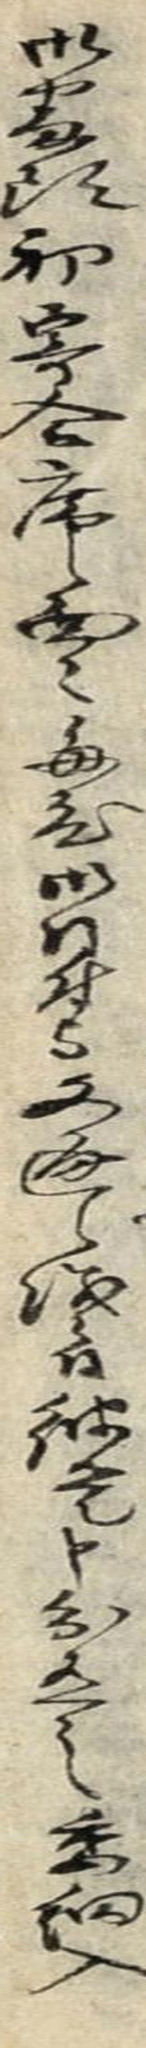御番頭初寄合席之面々毎度御目付と文通之儀に付彼是申分有之委細入
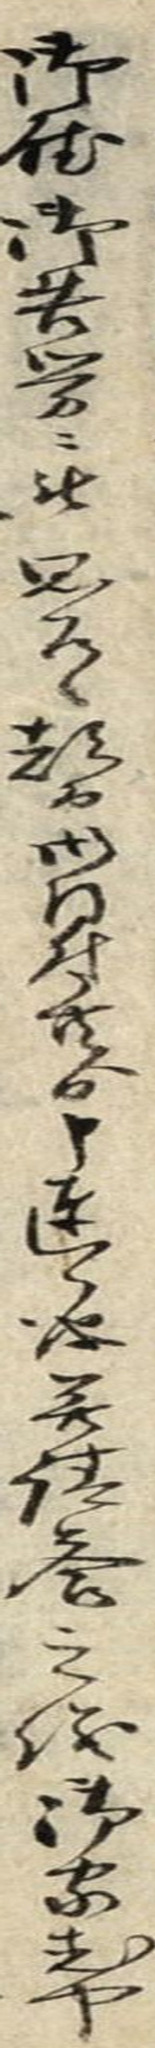御聴御苦労に被思召候都而御目付共ゟ申達候儀并請答之儀御家老中
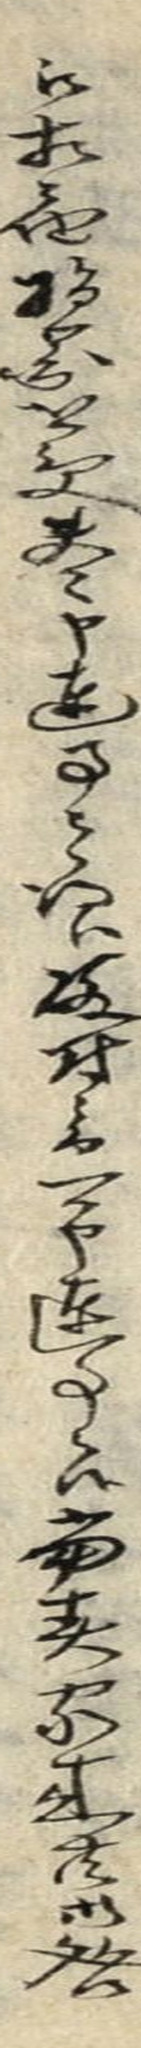江相届指図を受夫々申達候事に候得は殿付に而可申達事に候当春家来共御咎
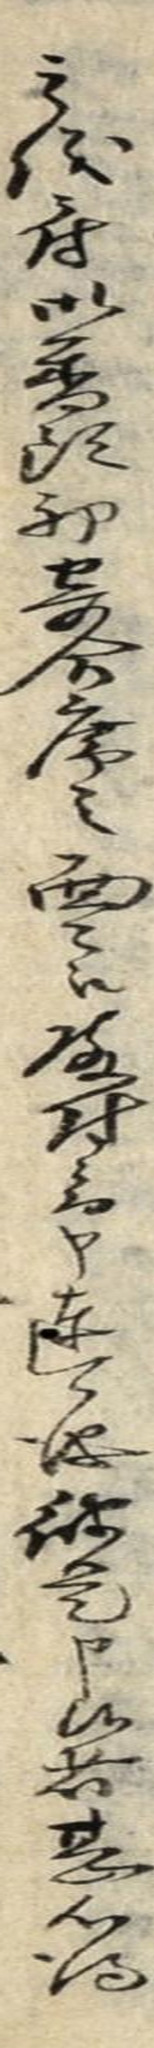之儀に付御番頭初寄合席之面々江殿付に而申達候儀彼是申候者甚心得
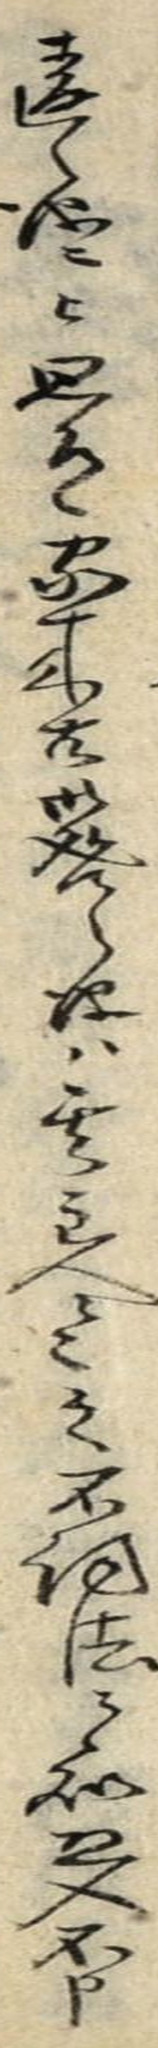違之儀に被思召候家来共御咎之儀は其主人〃〃之不調法に候処恐入不申
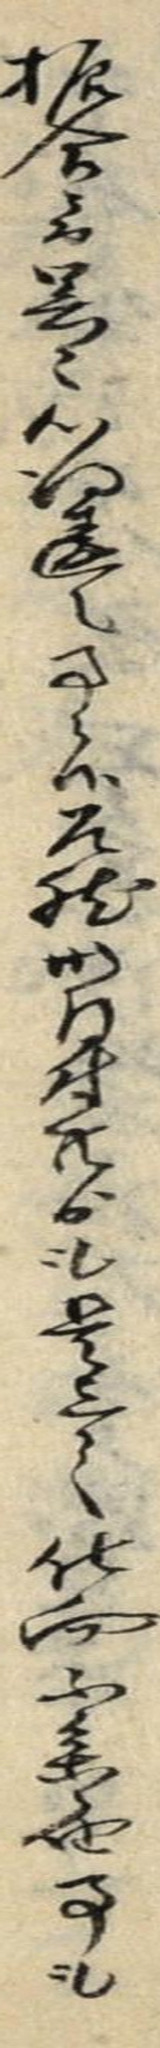振合に而呉々心得違之事に候乍然御目付共ゟも是迄之仕向不参届事も

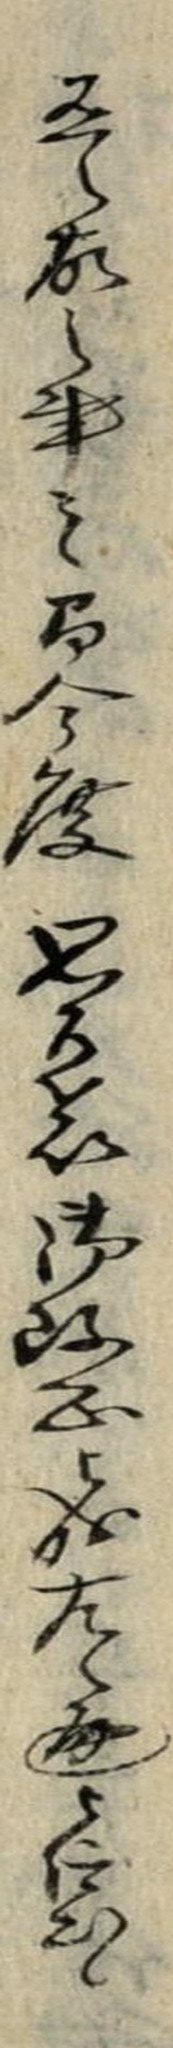有之故之事に候間今度思召を以御改正被成左之通被仰出候
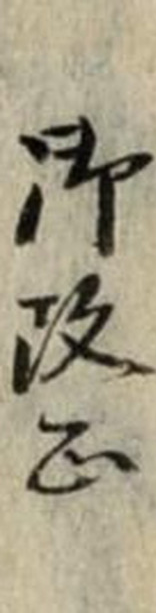御改正
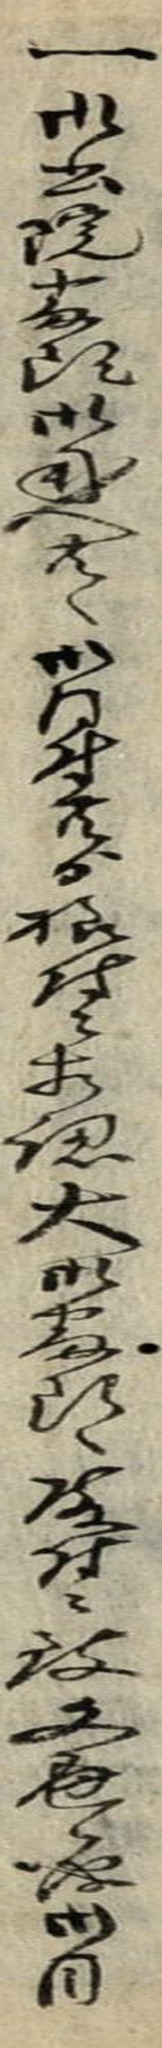一御書院番頭御用人共へ御目付共ゟ様付に相認大御番頭へ殿付に致文通候儀御目
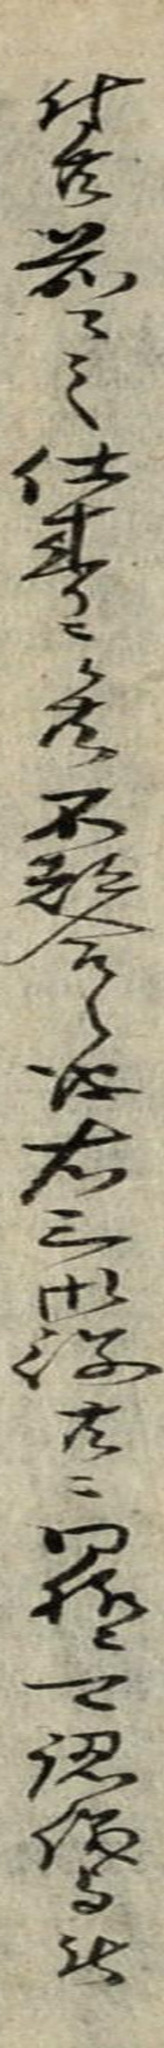付共前々之仕来り候共不都合之儀右三御役共に同様に可認儀と被
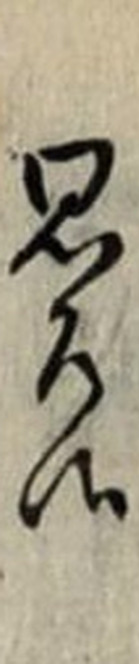思召候
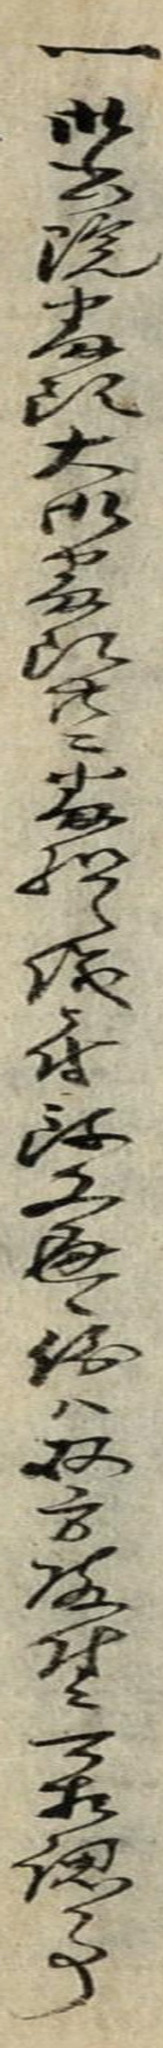一御書院番頭大御番頭共に番組之儀に付致文通候儀は双方殿付に可相認候事
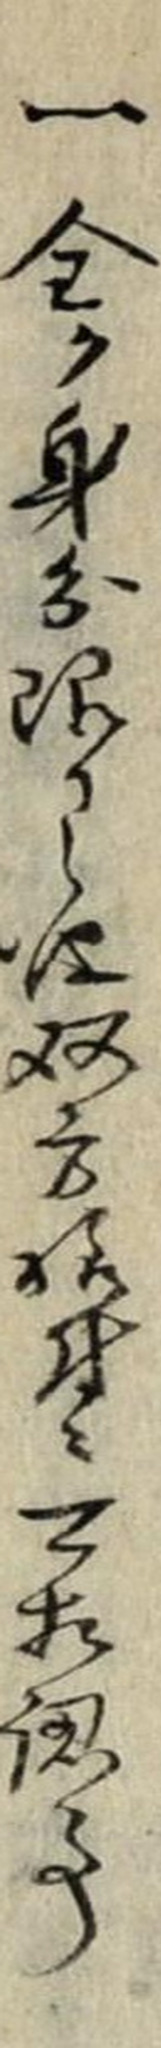一全く身分限り之儀双方様付に可相認候事
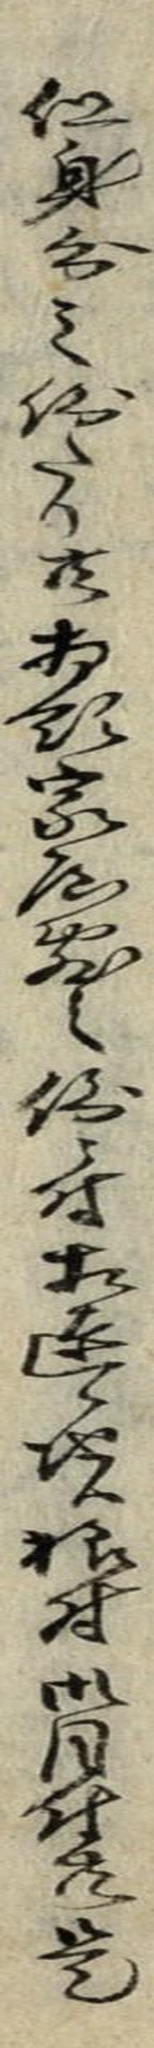但身分之儀たり共拝領家屋敷之儀に付相達候儀は様付御目付共是
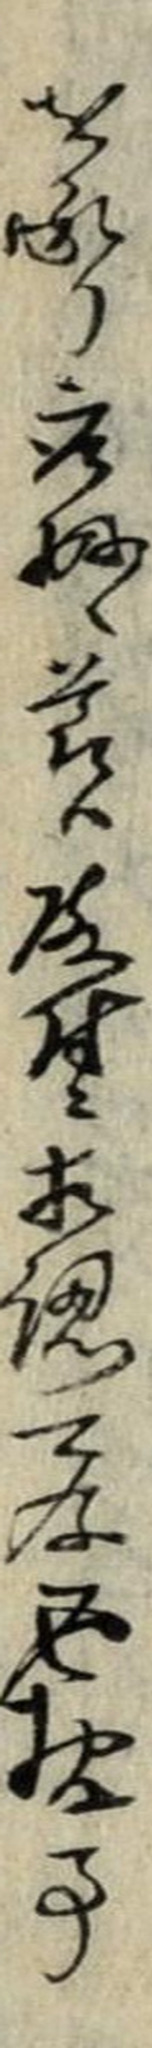を承り取扱候節は殿付に相認可及返報事
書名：蒐輯之部
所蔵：福井県文書館 Fukui Prefectural Archives
